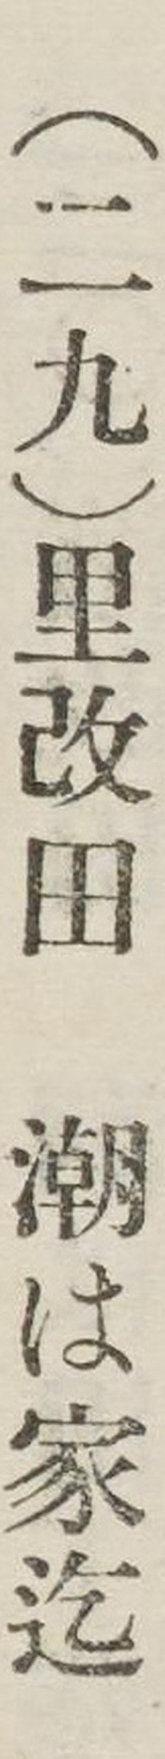里改田潮は家迄

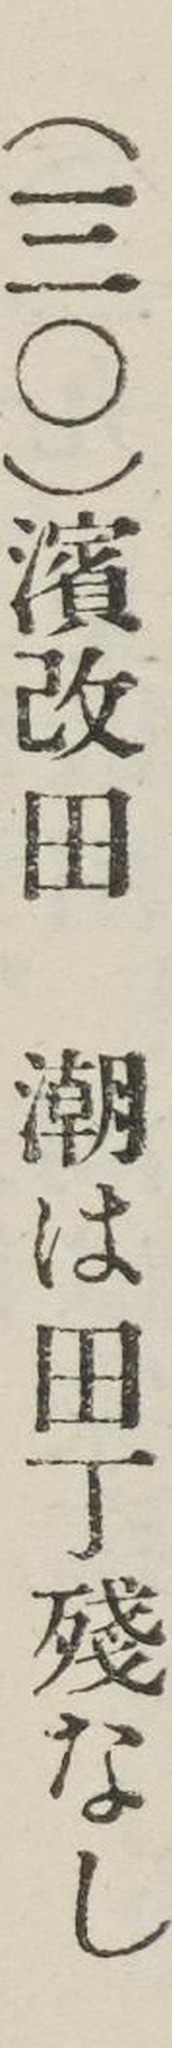濱改田潮は田丁残なし
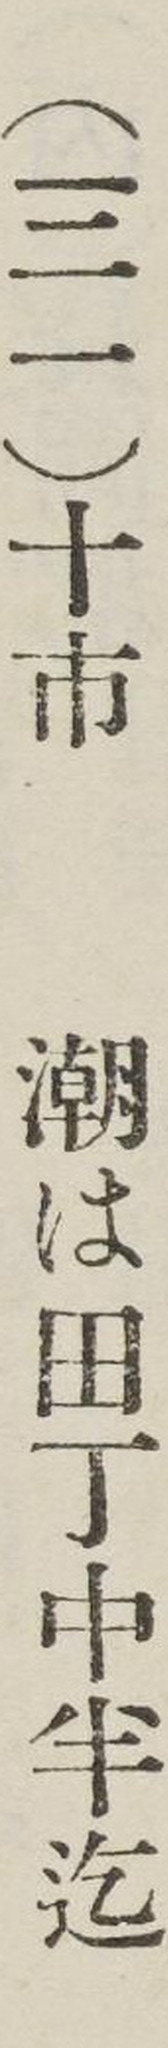十市潮は田丁中半迄
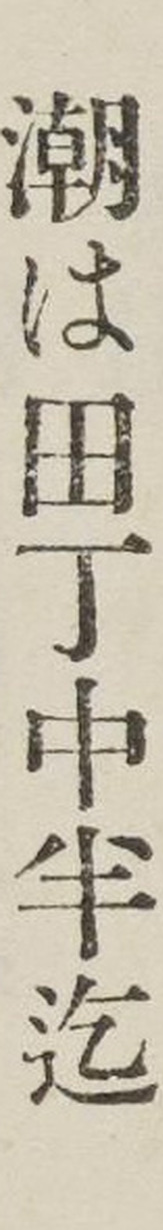十市潮は田丁中半迄
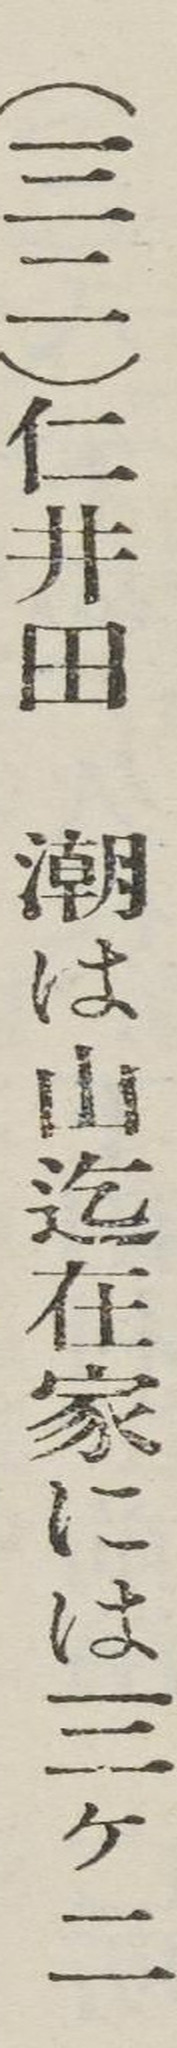仁井田潮は山迄在家には三ヶ二
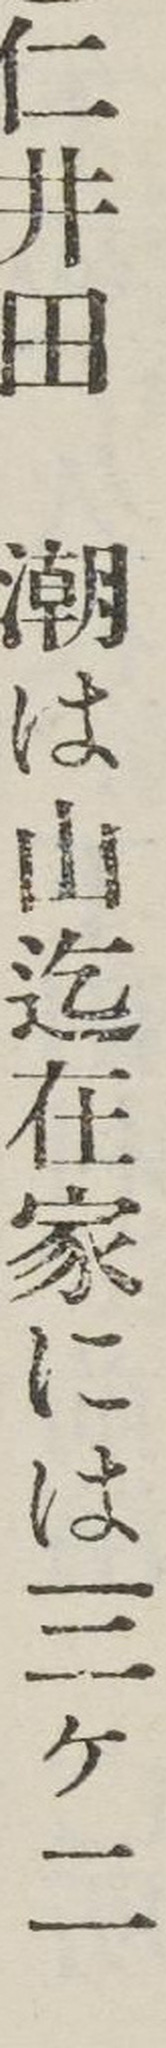仁井田潮は山迄在家には三ヶ二
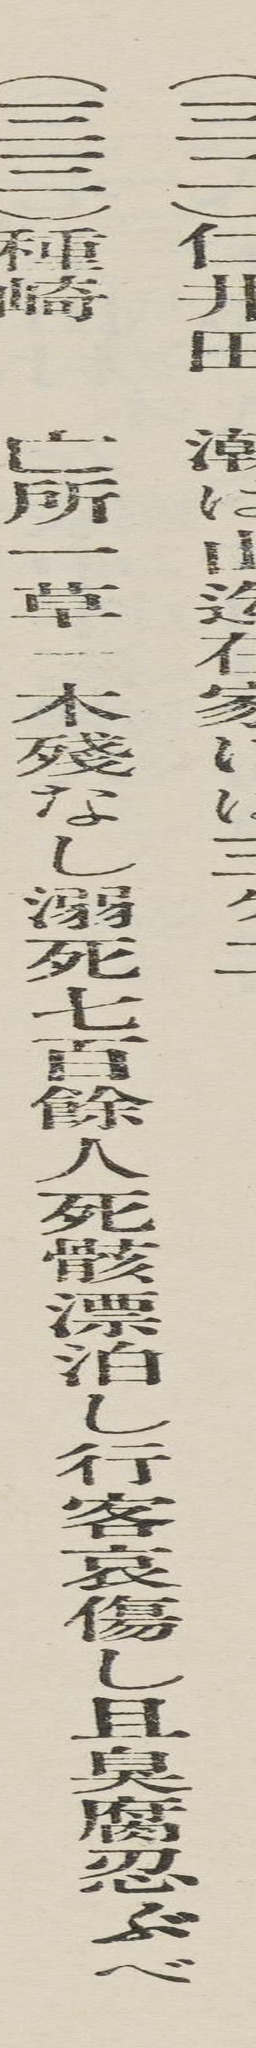種崎亡所一草木残なし溺死七百余人死骸漂白し行客哀傷し且臭腐忍ぶべ
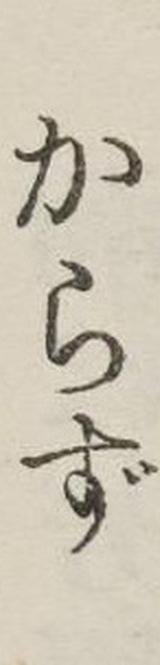からず
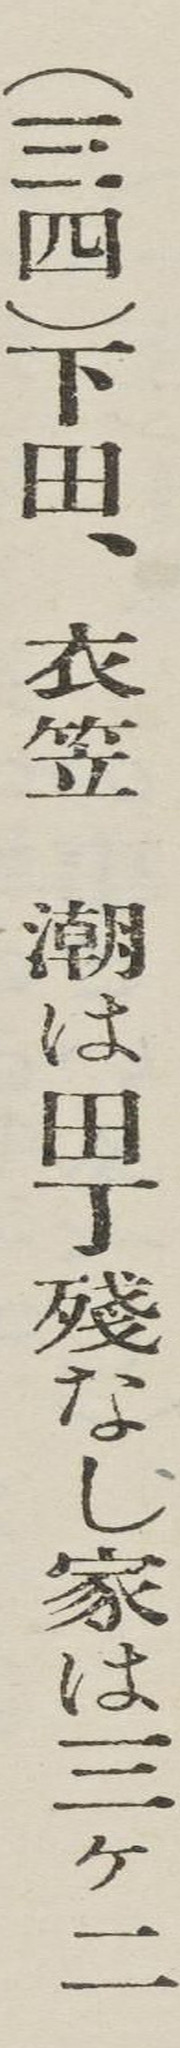下田、衣笠潮は田丁残なし家は三ヶ二
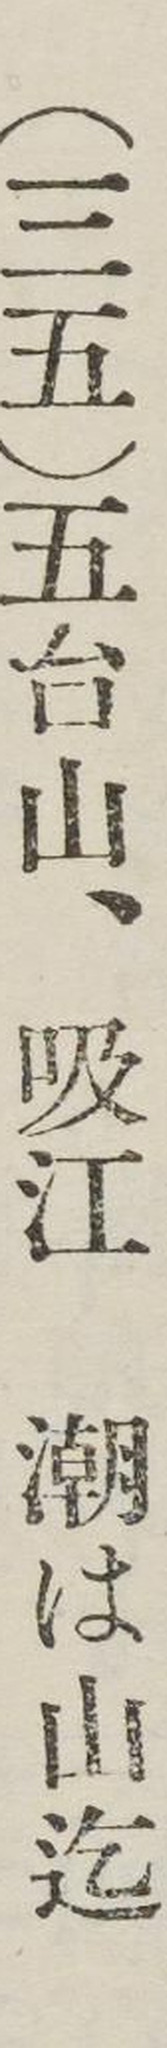五台山、吸江潮は山迄
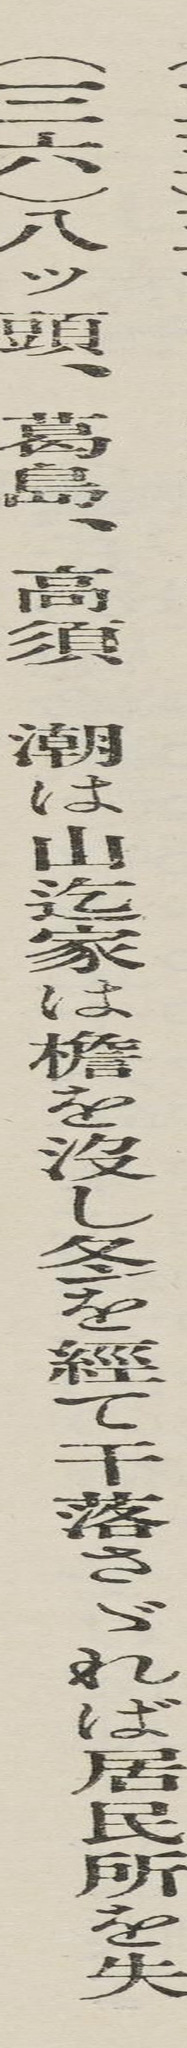八ツ頭、葛島、高須潮は山迄家は檐を没し冬を経て干落さゞれば居民所を失
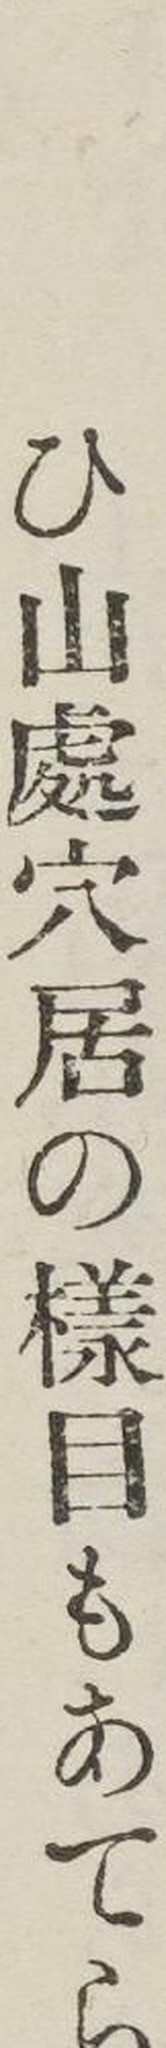ひ山処穴居の様目もあてられず
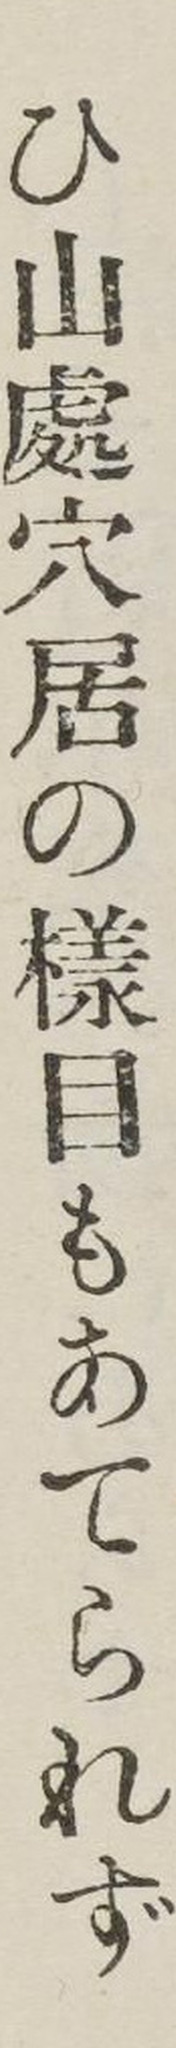ひ山処穴居の様目もあてられず
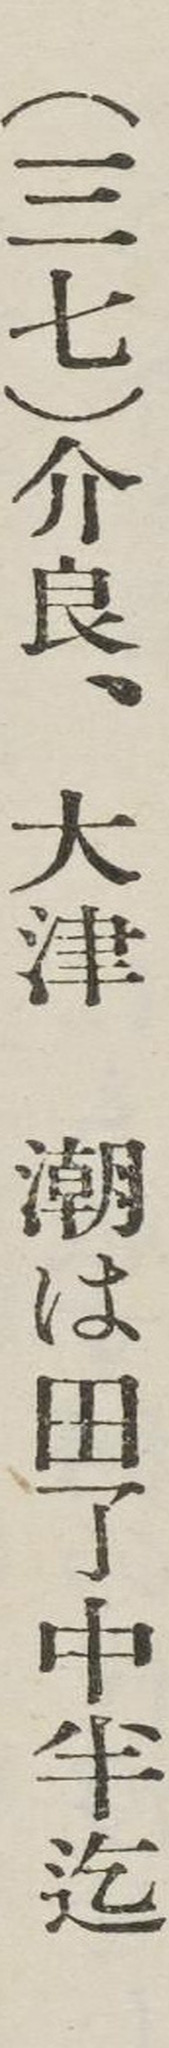介良、大津潮は田丁中半迄
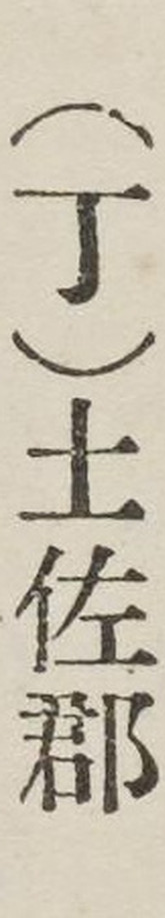土佐郡
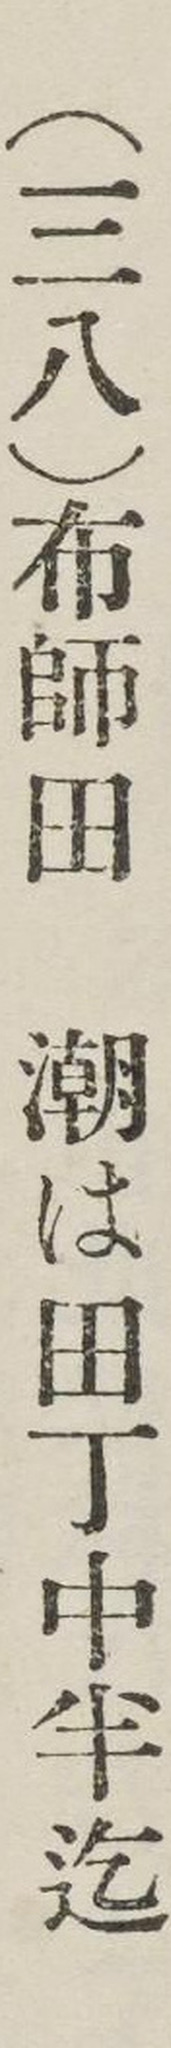布師田潮は田丁中半迄
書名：土佐古今ノ地震
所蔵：東京大学地震研究所図書室 Earthquake Research Institute Library, The University of Tokyo, JAPAN
